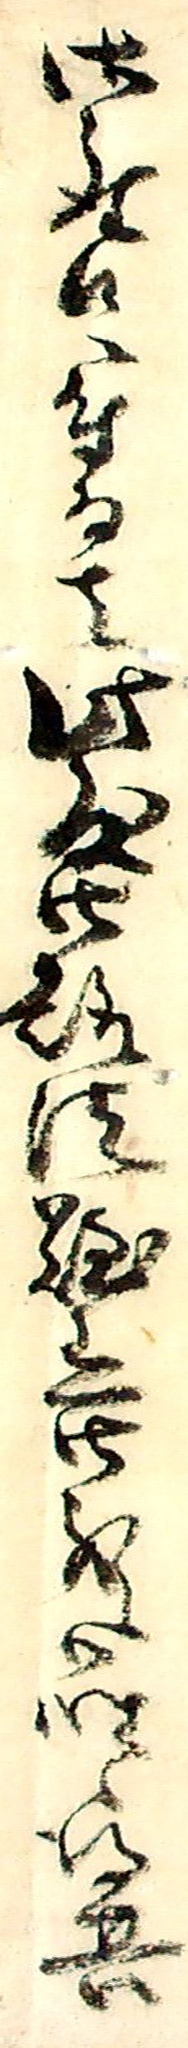御座候に付ては此度御趣法難有御義に御座候得共
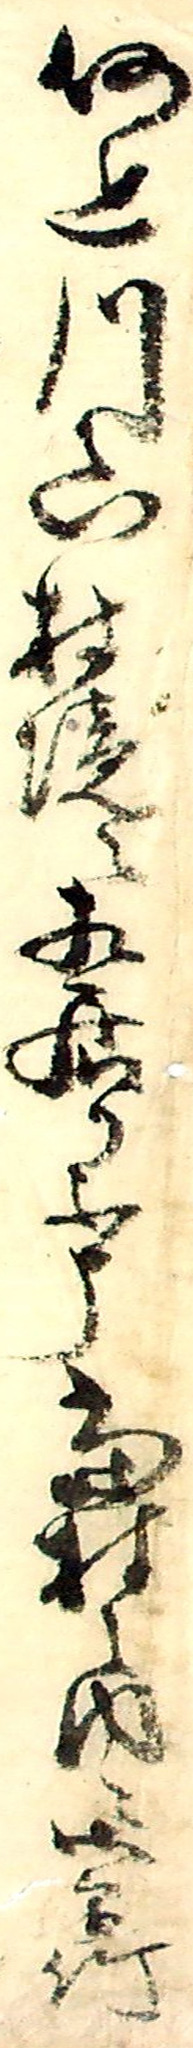何れ川真村境に相居り不申当村之内に御印竹
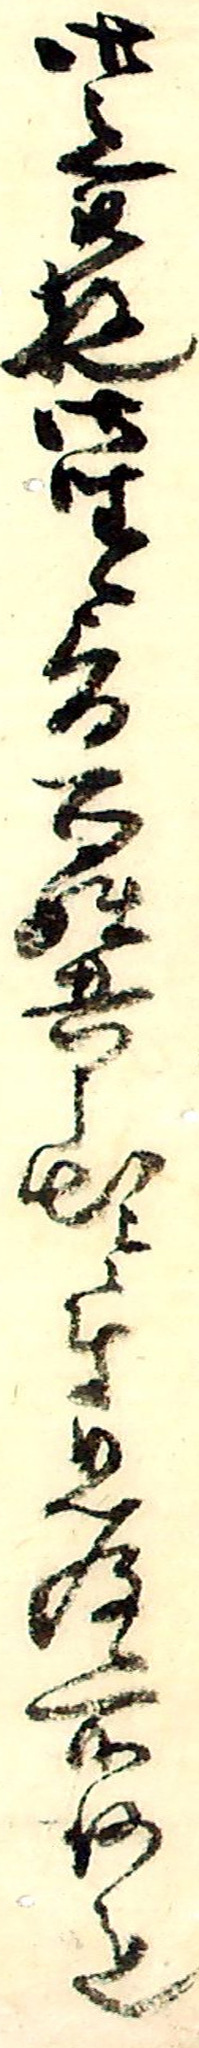御立被遊御座候旨百姓共申出候に付見及候所何れ
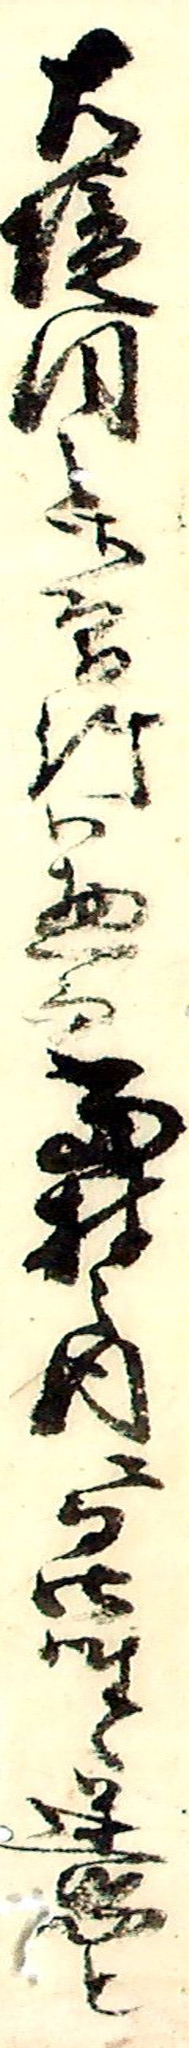右境目之御印竹は惣て当村之内にて御座候迷惑と
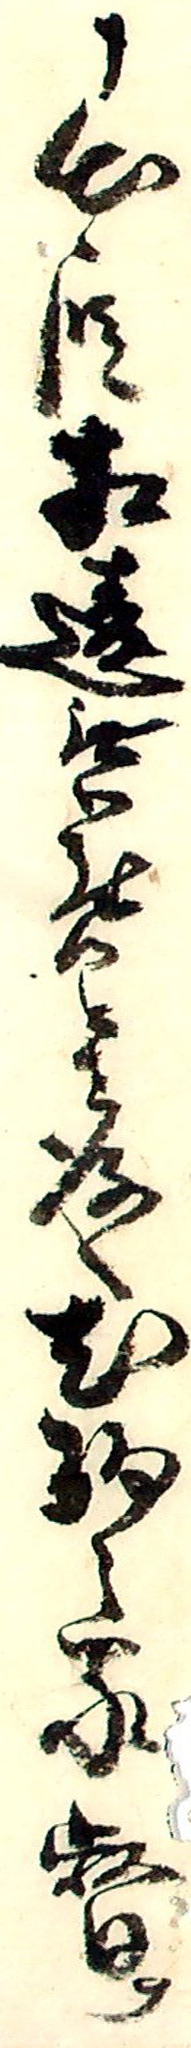申出候段相違無御座候と奉存候尤聊之家督を

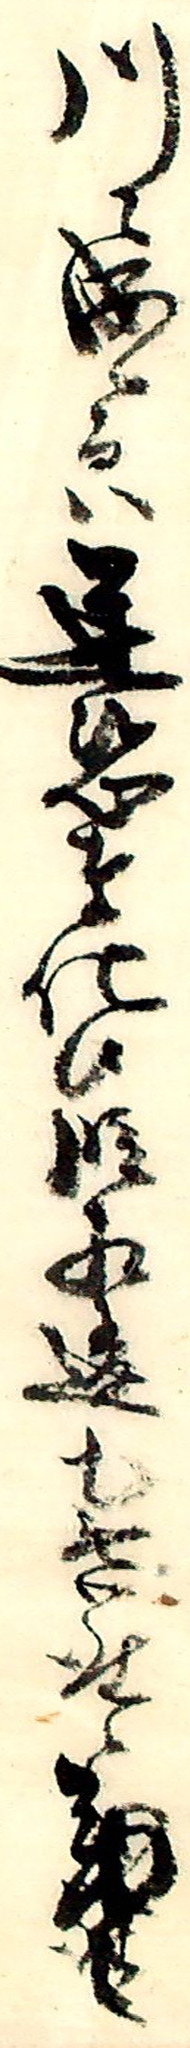川に成候ては迷惑奉仕候段相違も無御座候義と
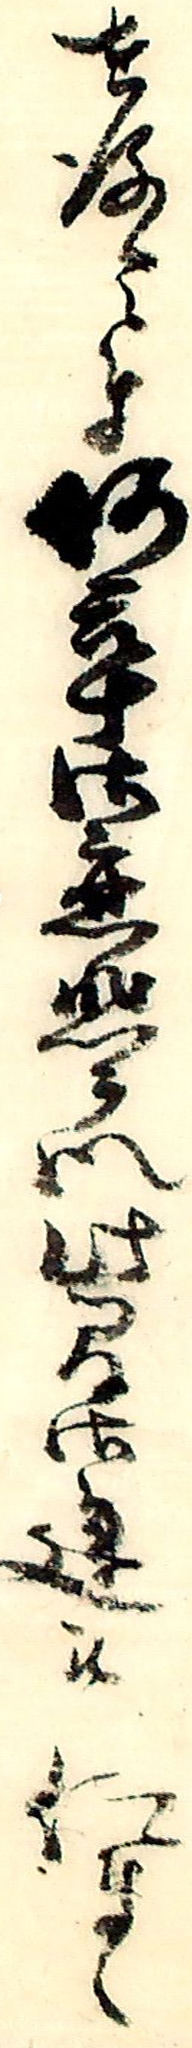奉存候に付何卒御慈悲を以此間御建被仰付候
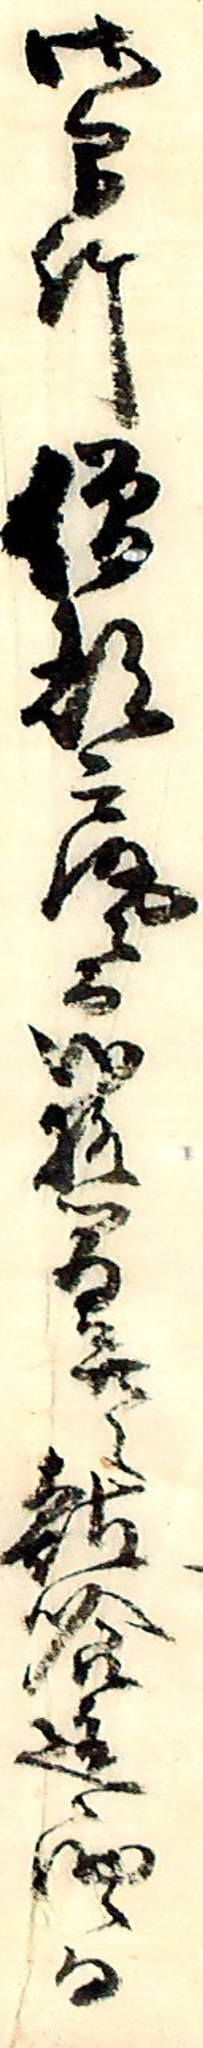御印竹僧都尻にて弐拾間并に鮎喰道筋にて
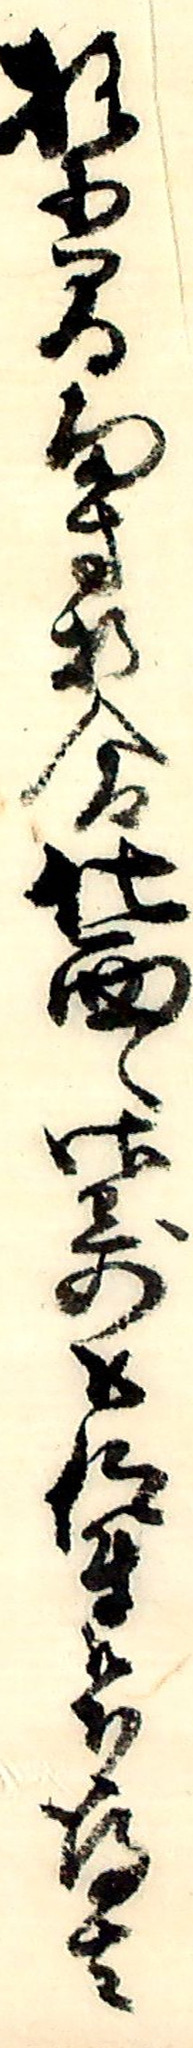拾五間両方折合仕西へ御寄被仰付被下候得は
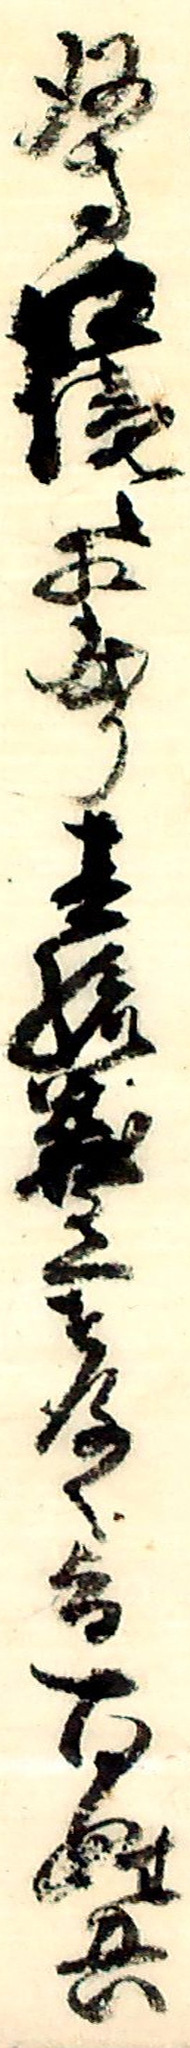双方郷境に相当り壱統難有奉存候旨百姓共
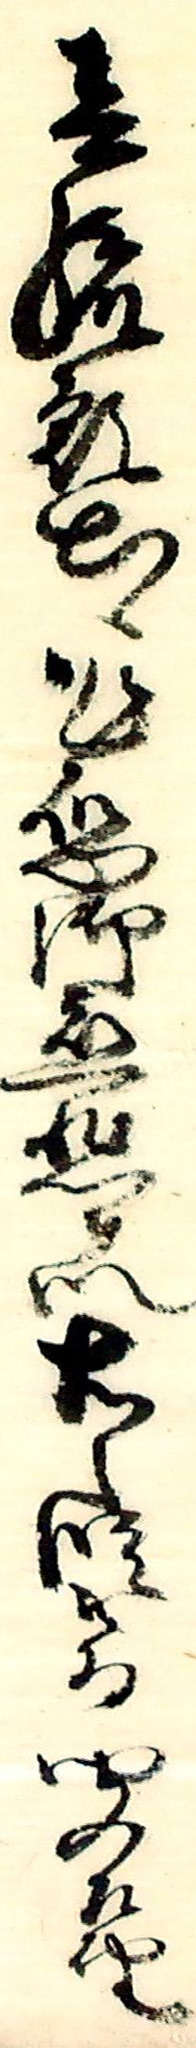壱統願出候乍恐御慈悲を以右之段被為聞召届
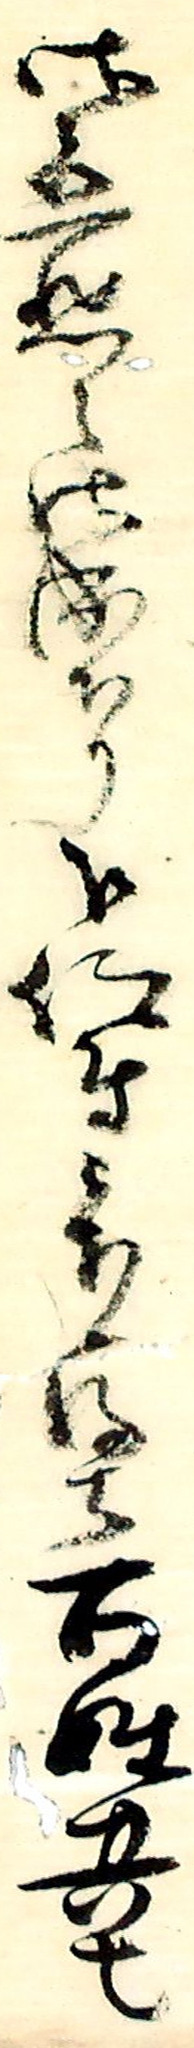御慈悲之御成下り被仰付被下候得は百姓共は
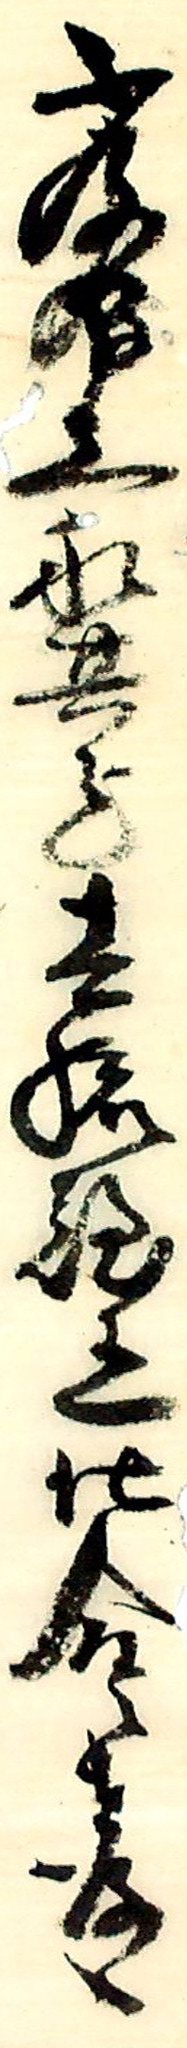不及申上私共迄壱統難有仕合に奉存候
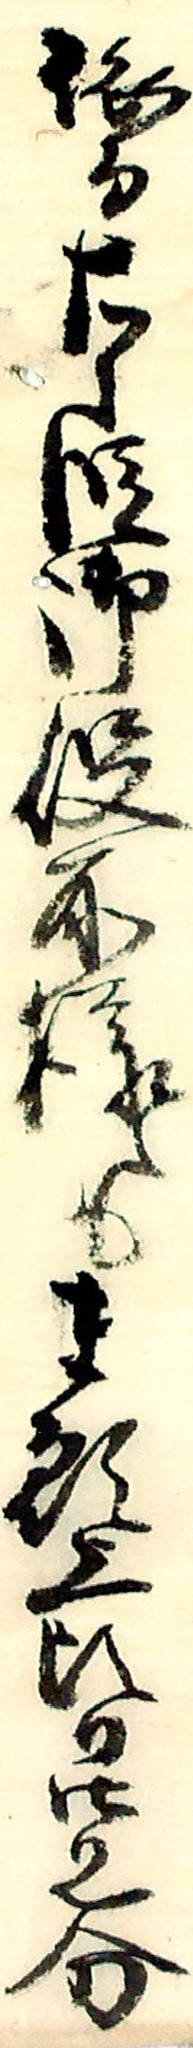依て右之段御役所様へも奉願上頃日御見分
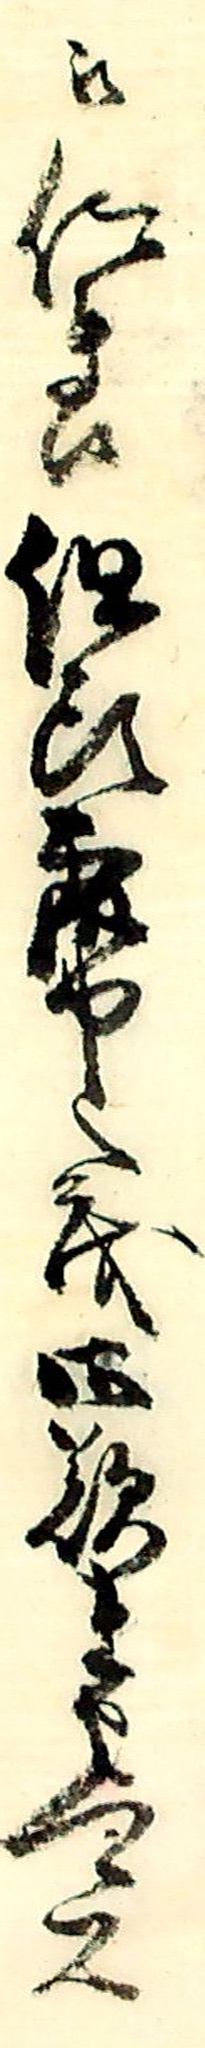被仰付候組頭衆中へも御歎奉申上候以上
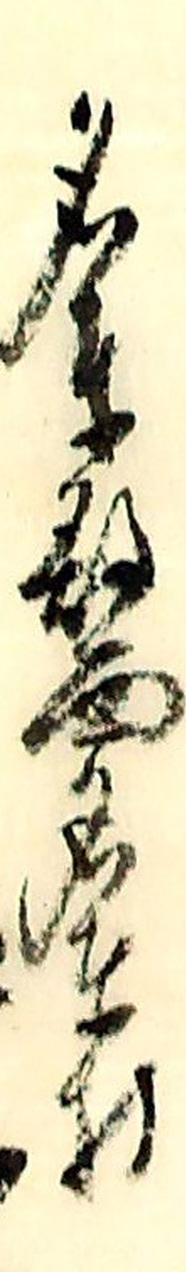名東郡西名東村
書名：諸御願書控(後藤氏壱番）
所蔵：鳴門教育大学 Naruto University of Education
